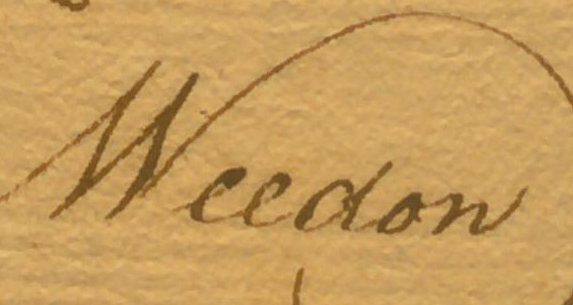Weedon
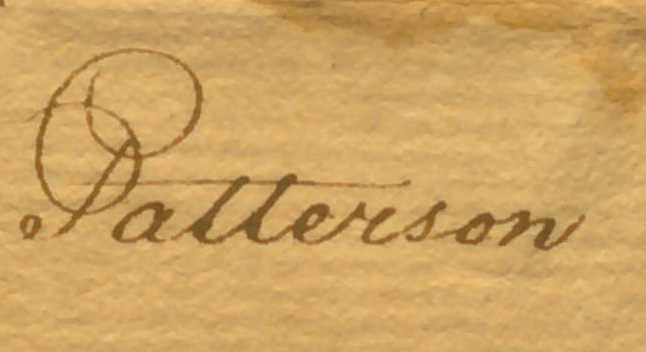Patterson
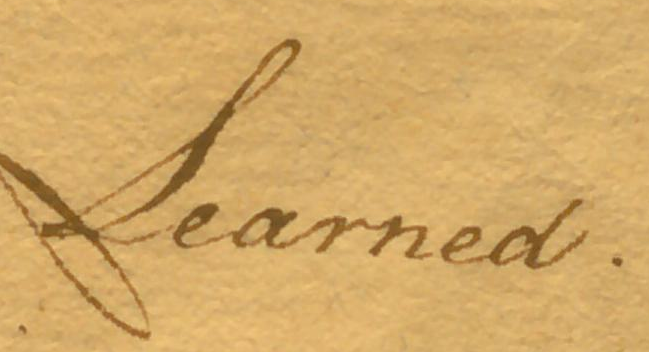Learned
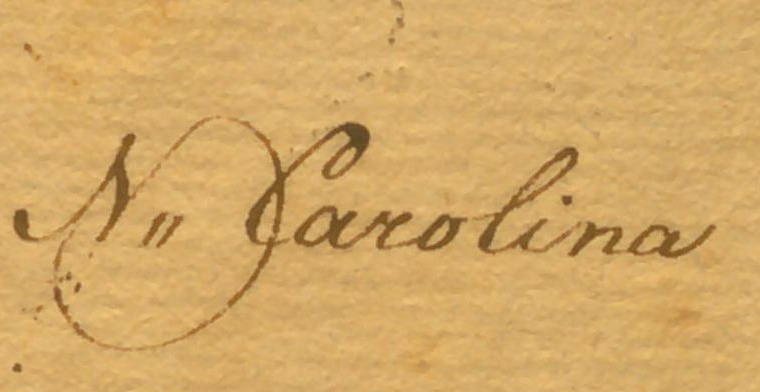N. Carolina
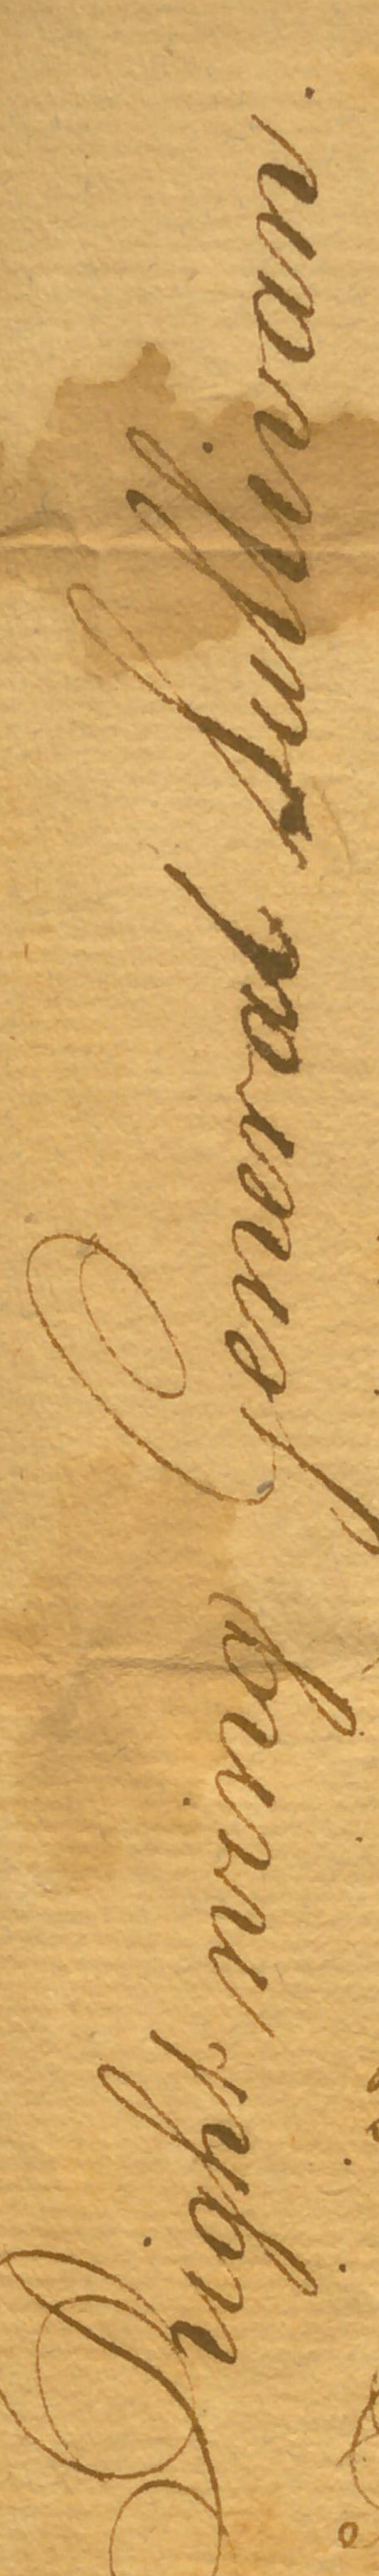Right wing General Sullivan
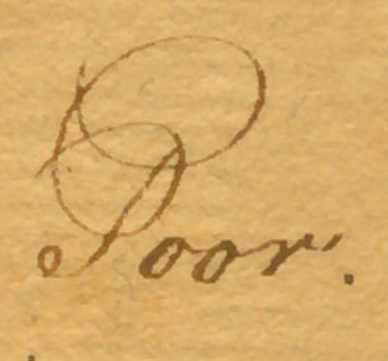Poor
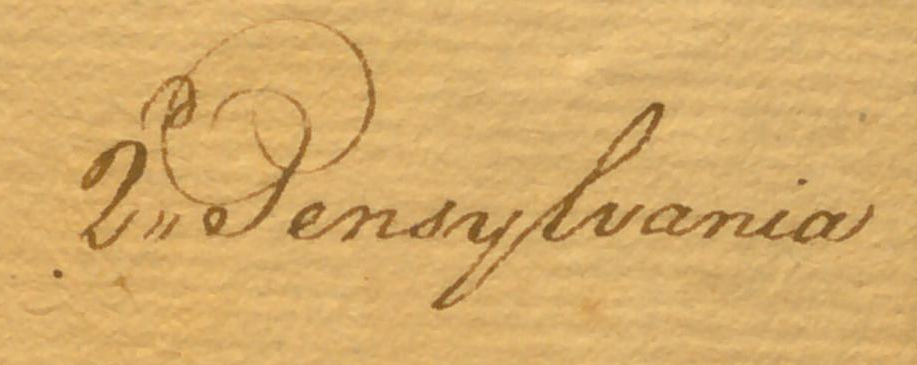2^d. Pensylvania
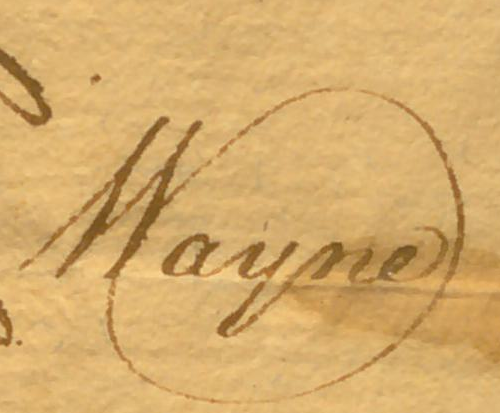Wayne
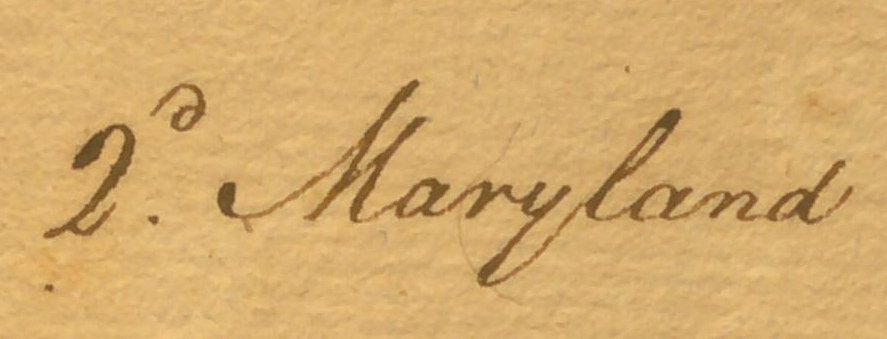2^d. Maryland
